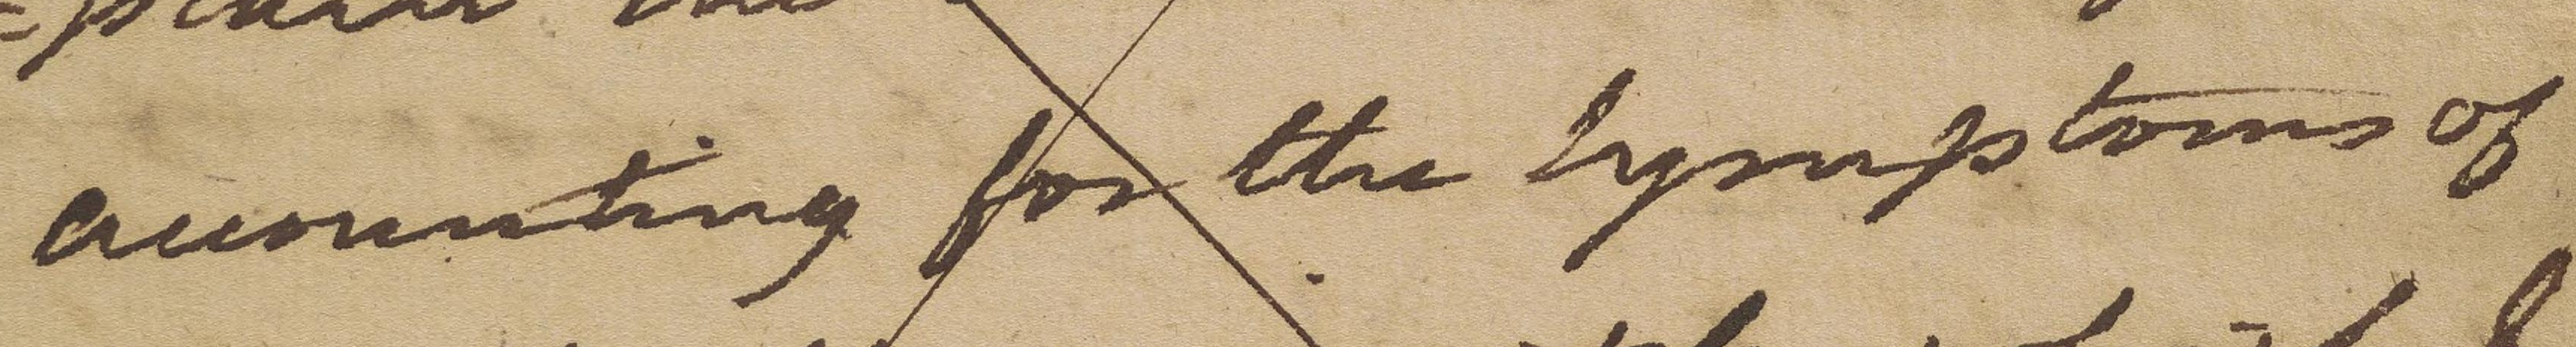accounting for the symptoms of
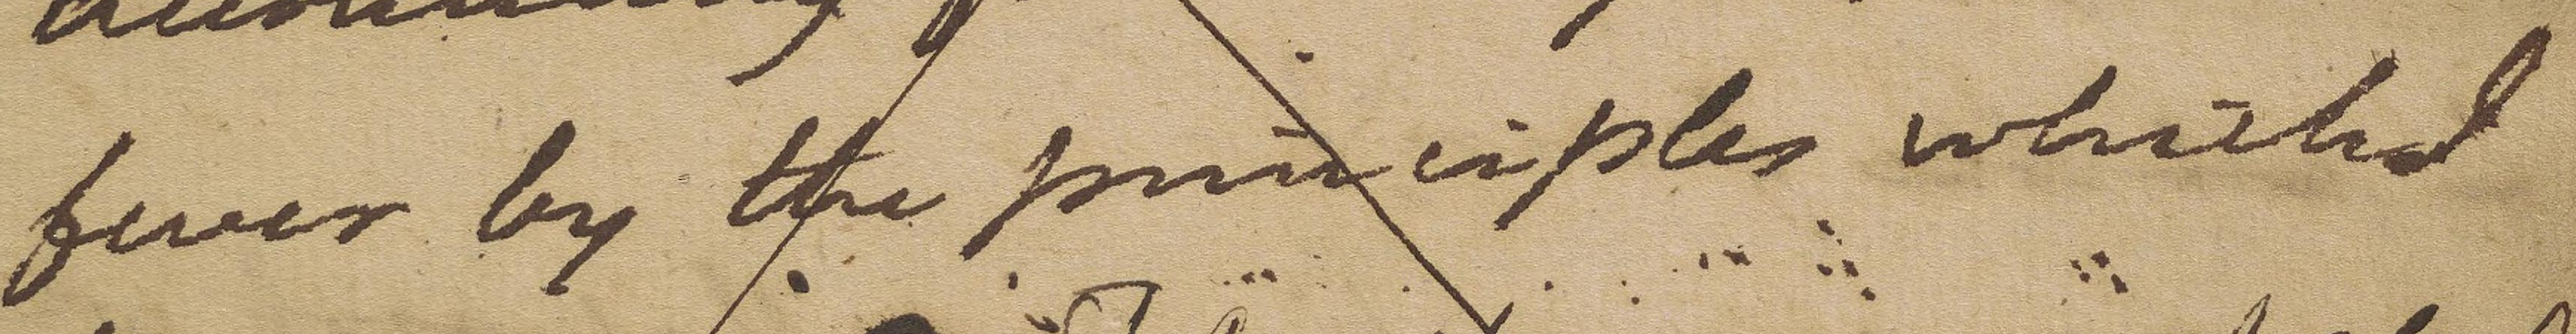fever by the principle which I
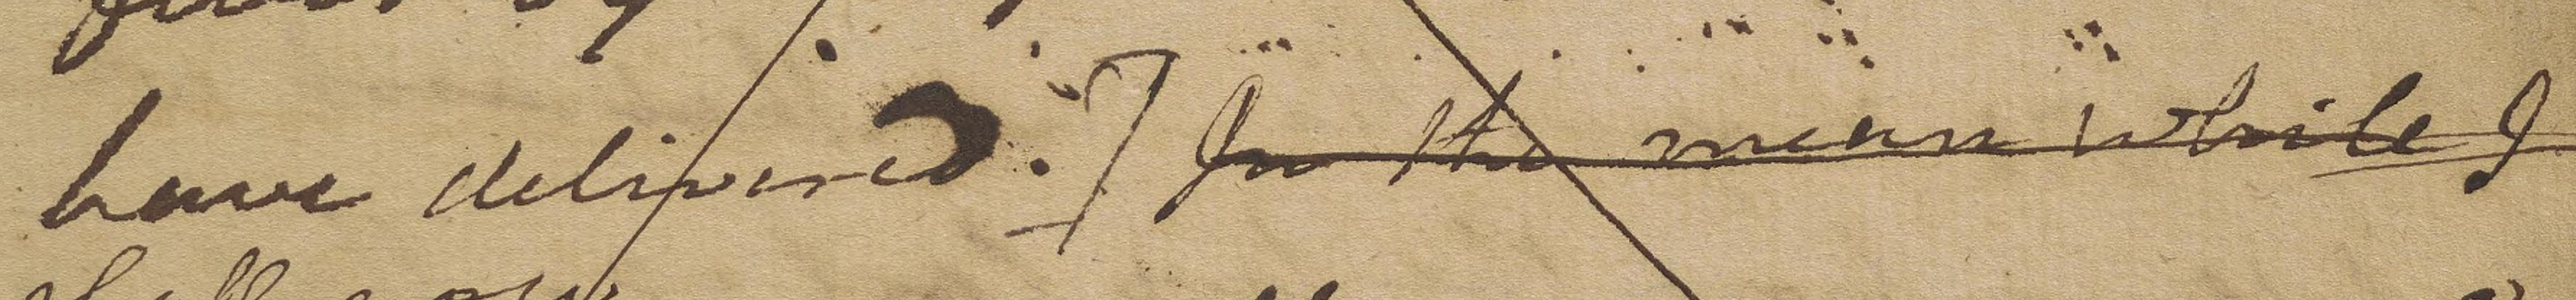have delivered.) In the meanwhile I
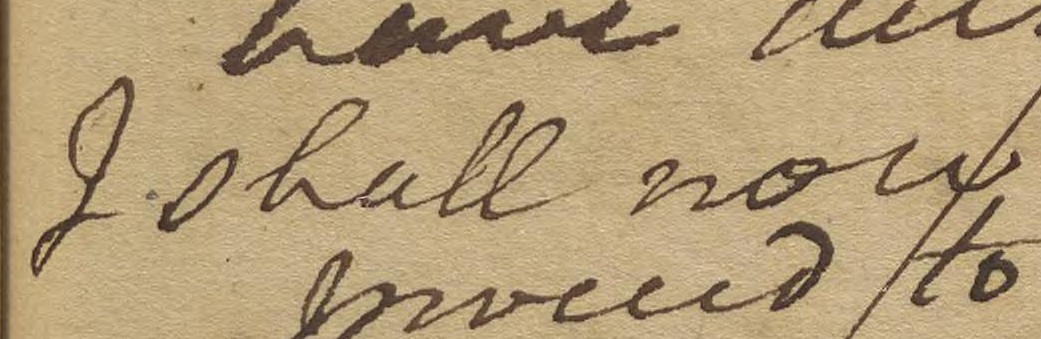I shall now
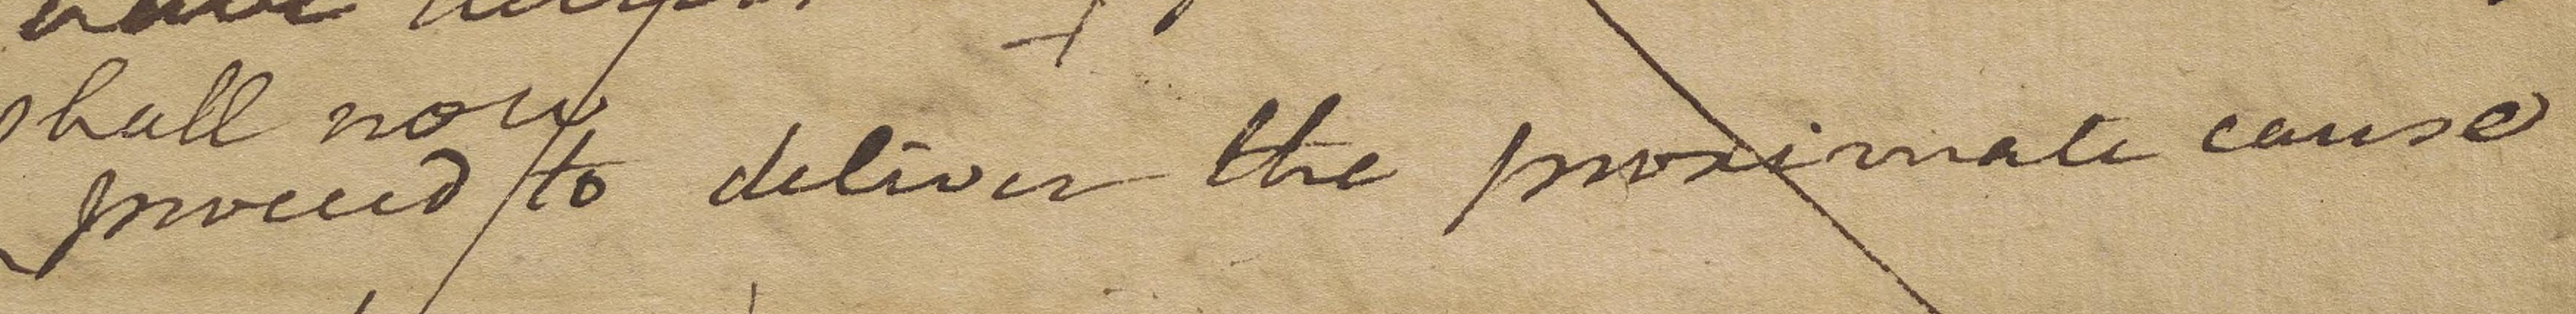proceed to deliver the proximate cause
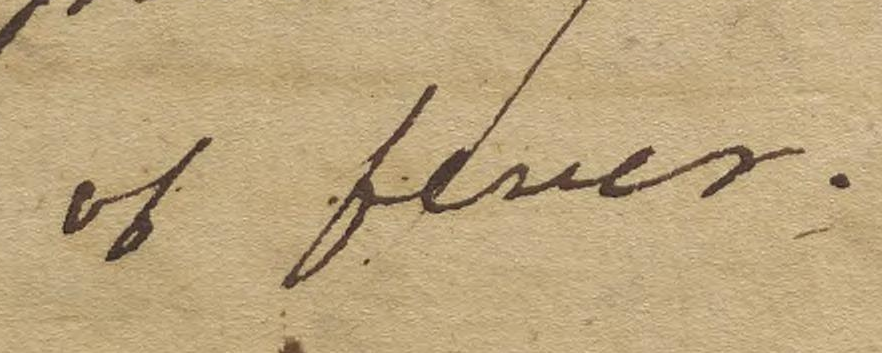of fever.
